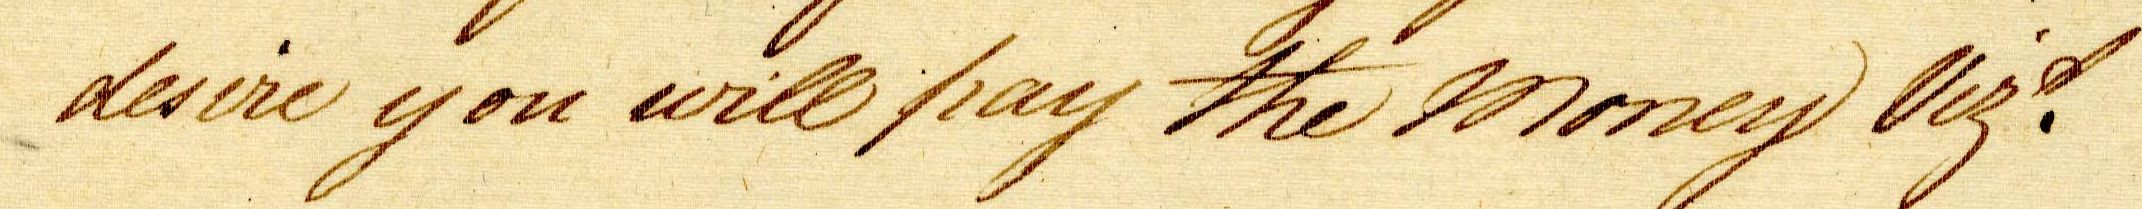desire you will pay the Money Viz^t.
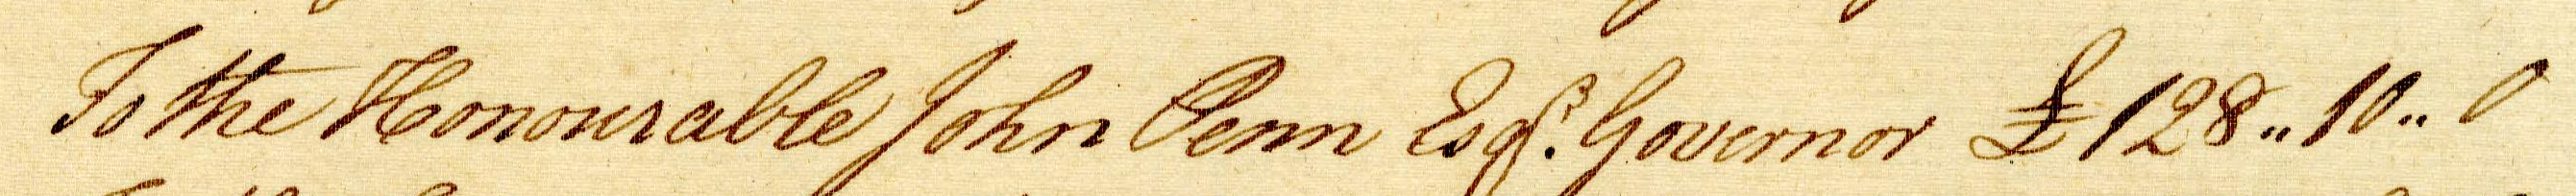To the Honourable John Penn Esq^r. Governor £128..10..0
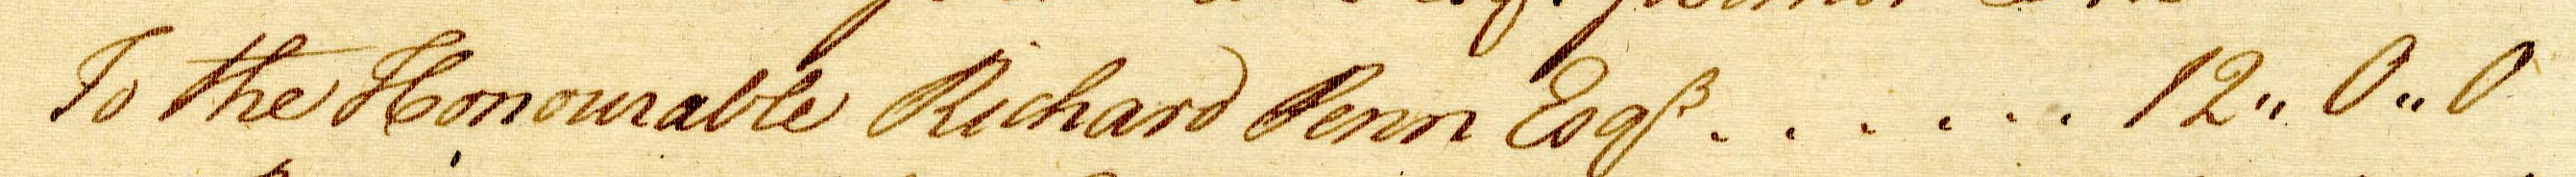to the Honourable Richard Penn Esq^r. ..... 12..0..0
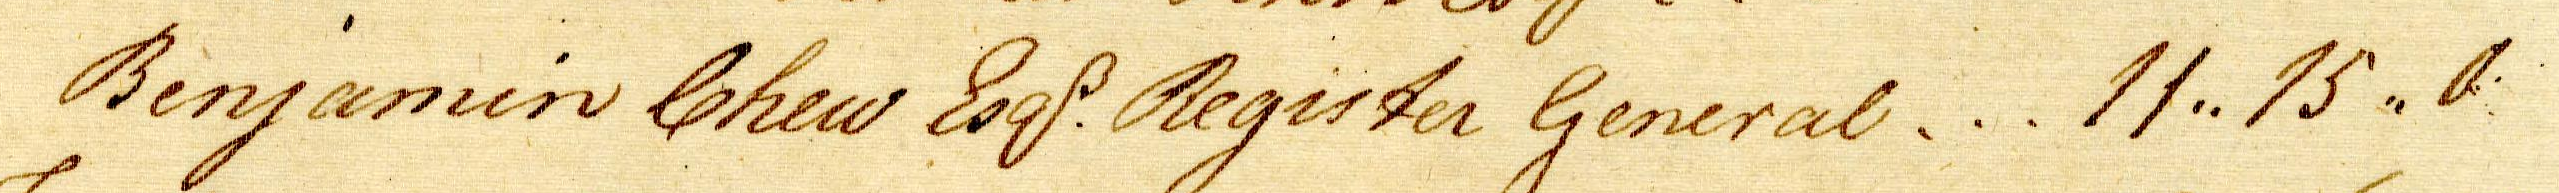Benjamin Chew Esq^r. Register General...11..15..0
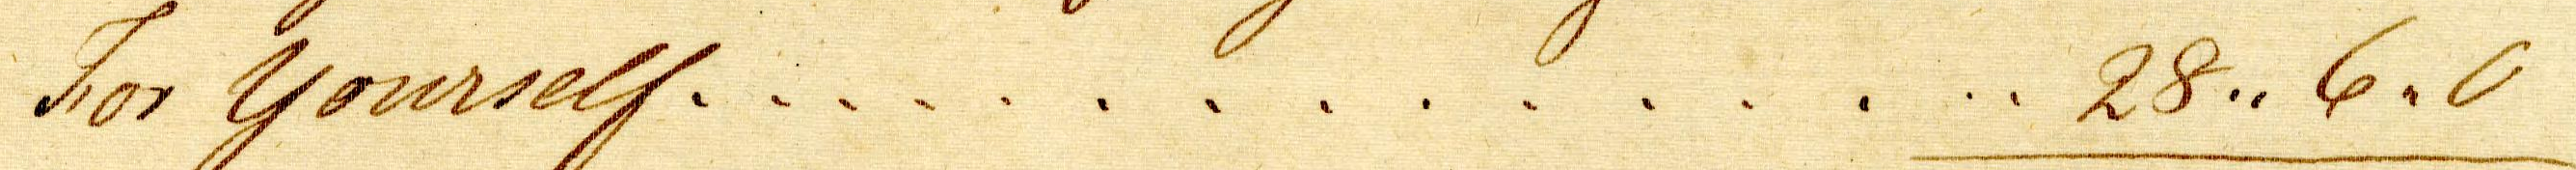For Yourself...............28..6..0
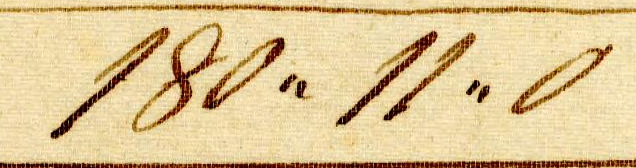180..11..0
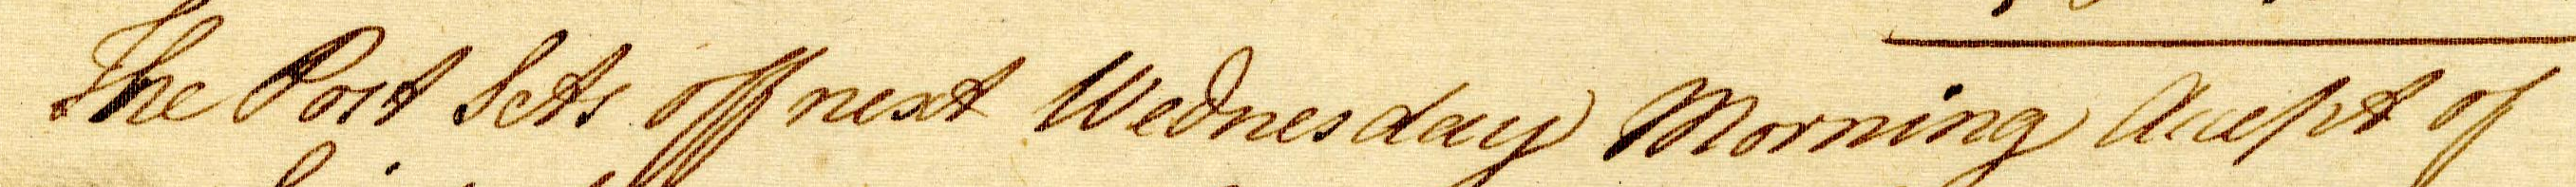The Post Sets off next Wednesday Morning Accept of
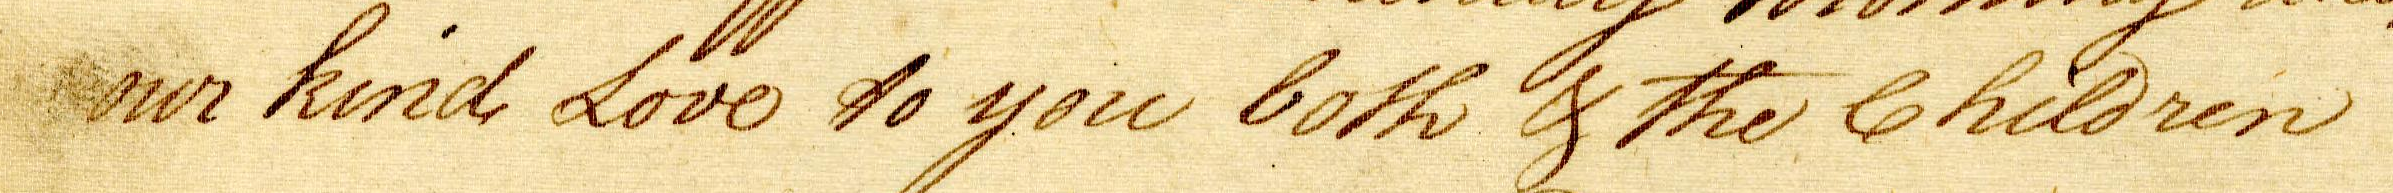our kind Love to you both & the Children
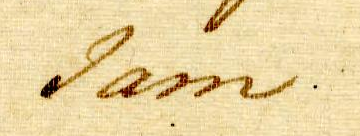I am
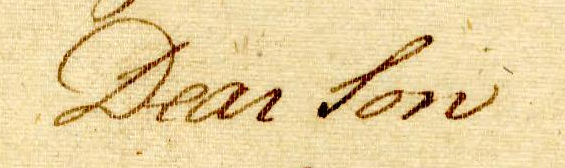Dear Son
